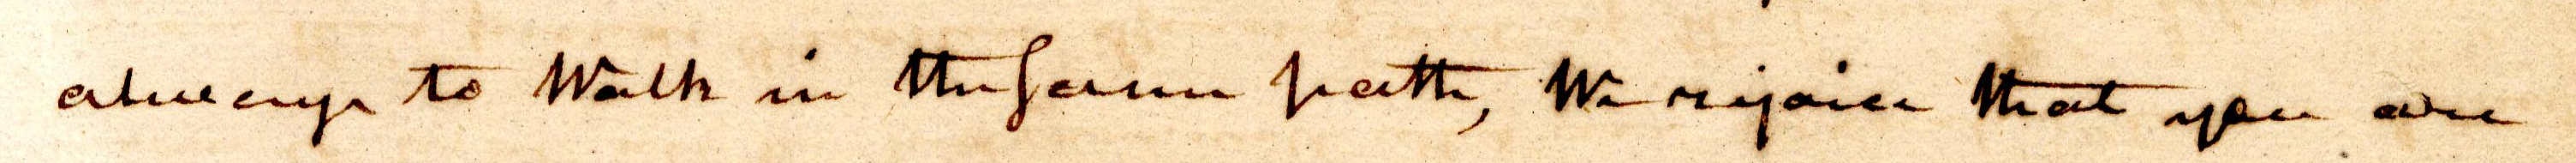always to Walk in the Same Path, We rejoice that you are
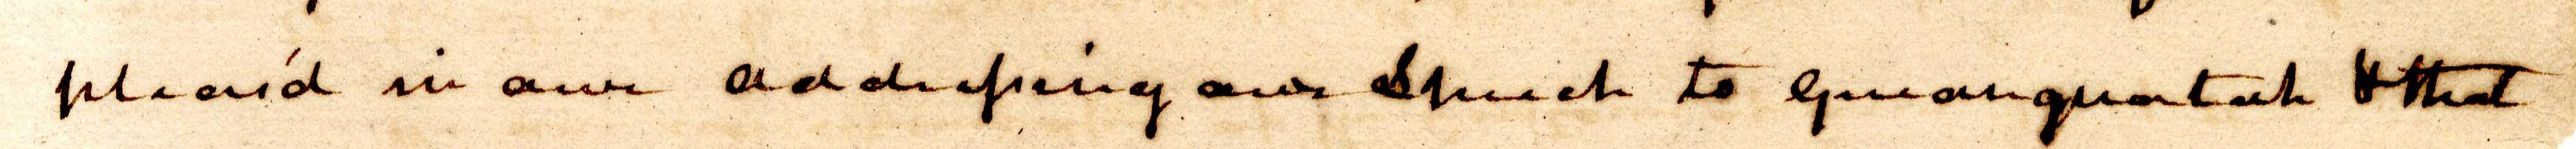pleas'd in our Addressing our Speech to Guanguatah & that
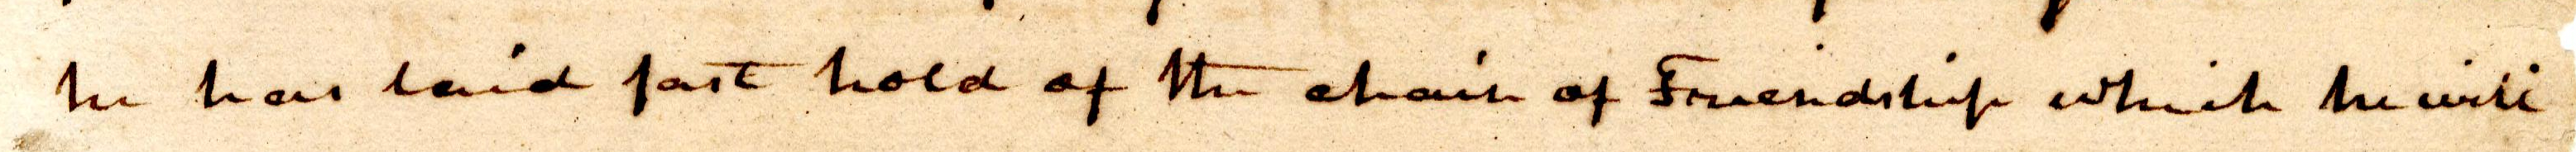he has laid fast hold of the chain of Friendship which he will
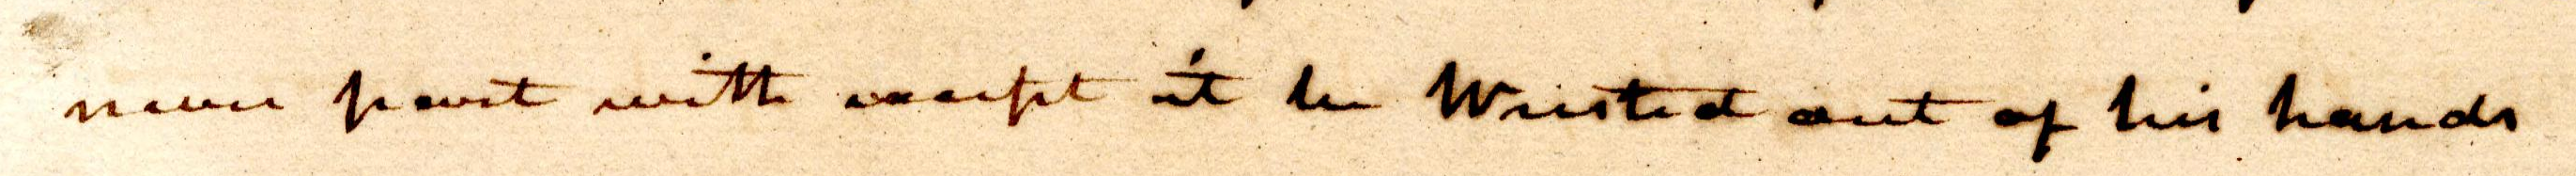never part with except it be Wrested out of his hands
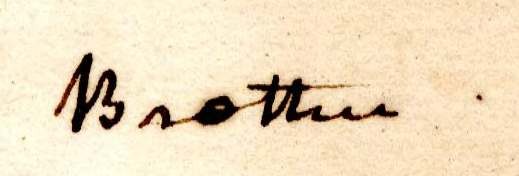Brother
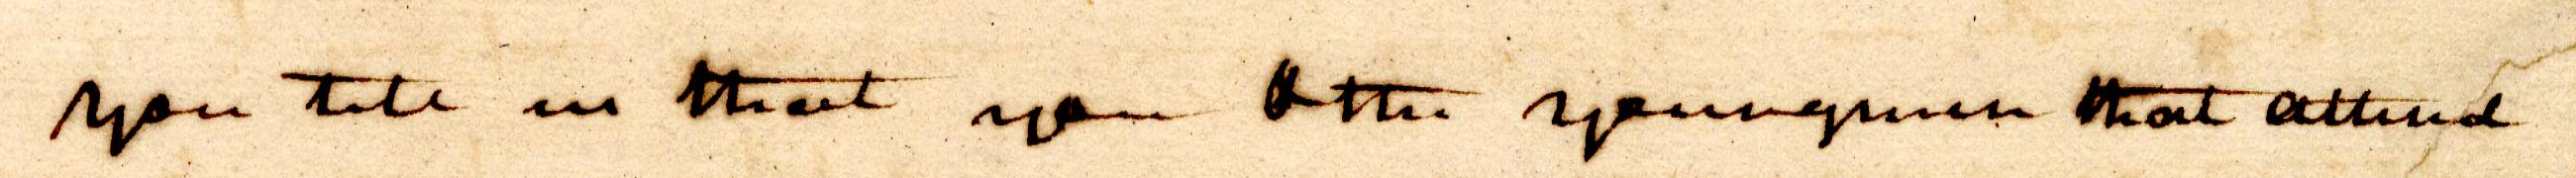you tell us that you & the young men that attend
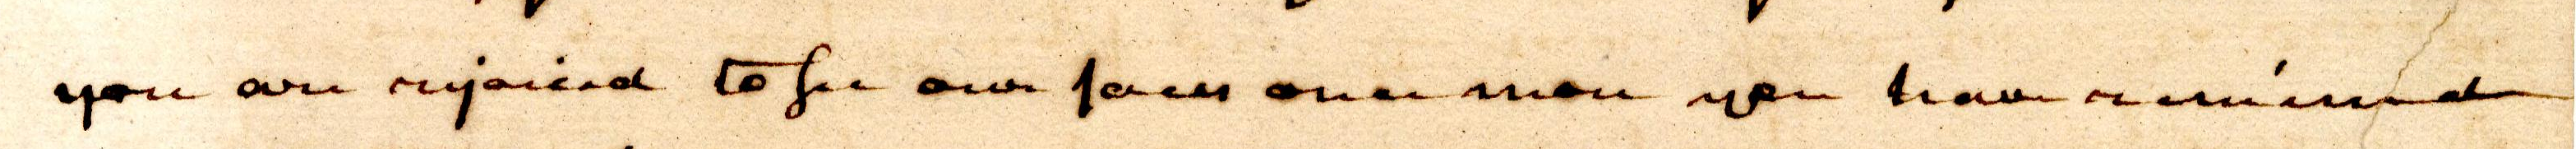you are rejoiced to see our faces once more you have reminded
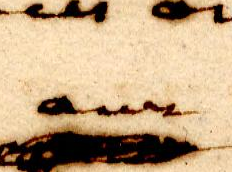our
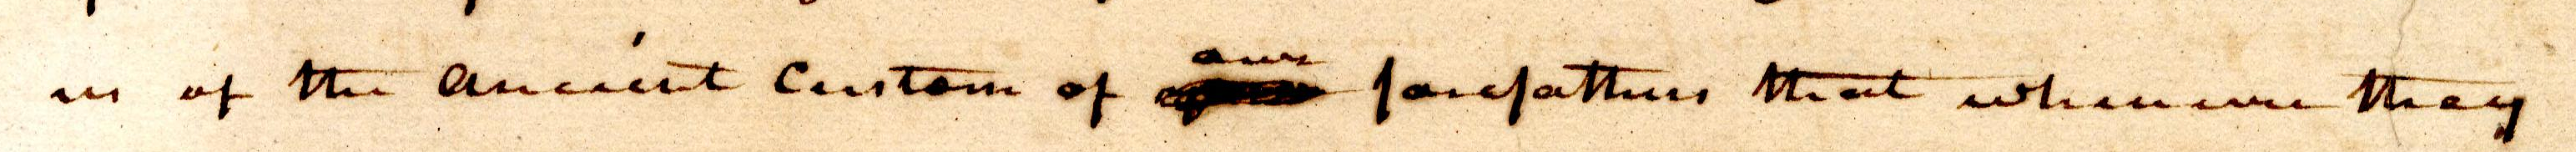us of the Ancient custom of [___] forefathers that whenever they
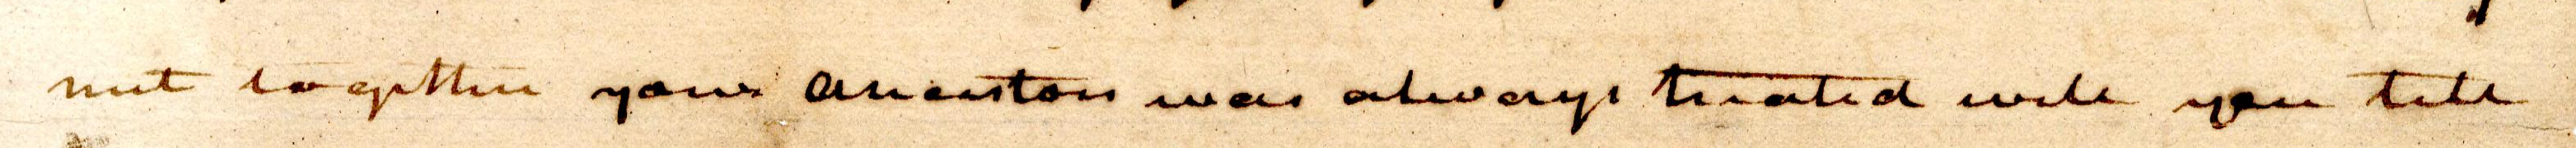met together your ancestor was always treated well you tell
